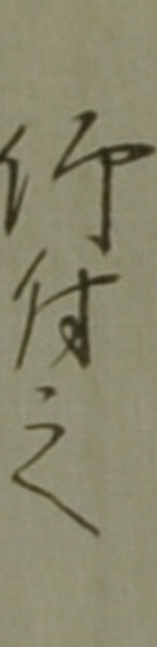仰付之
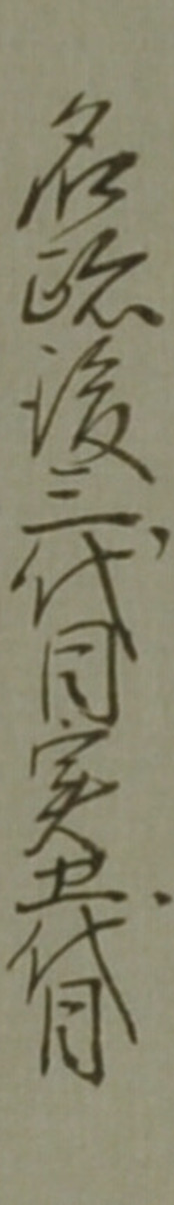名跡後三代目実五代目
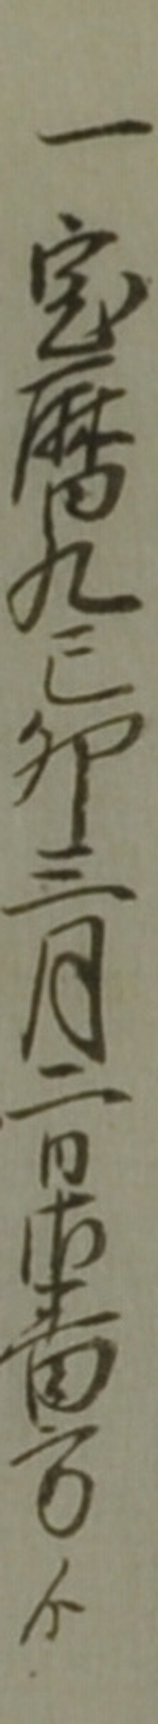一宝暦九己卯三月二日御番方より
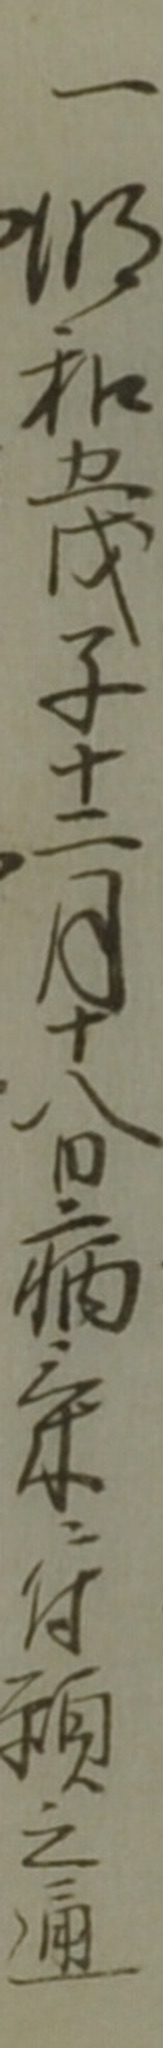一明和五戌子十二月十八日病気ニ付願之通
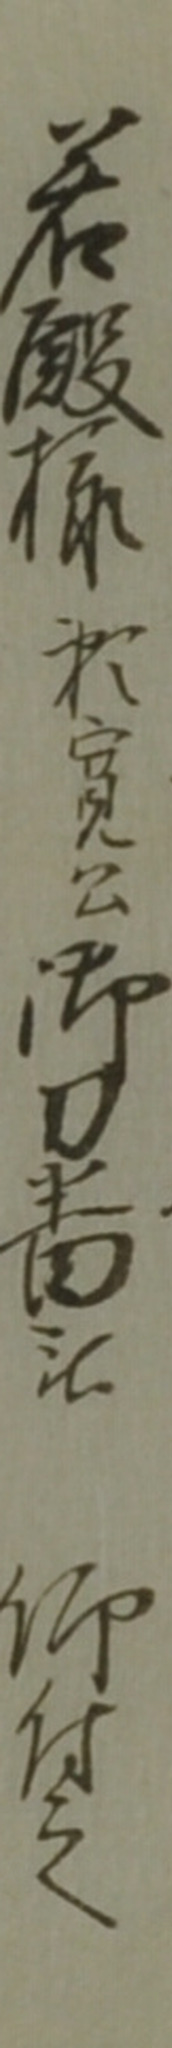若殿様頼寛公御刀番被仰付之
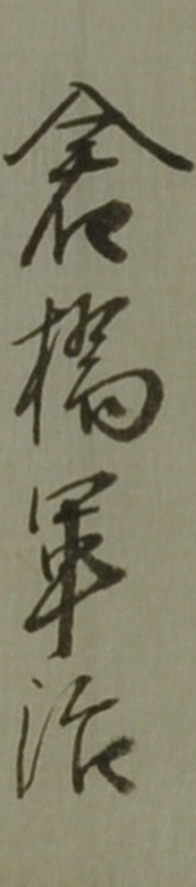倉橋軍治
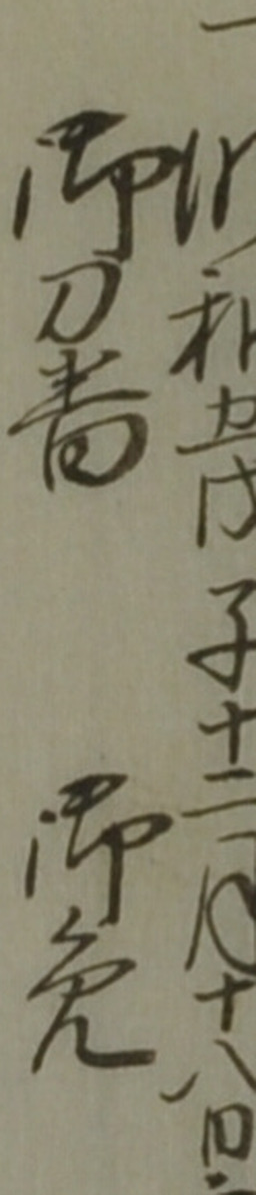御刀番御免
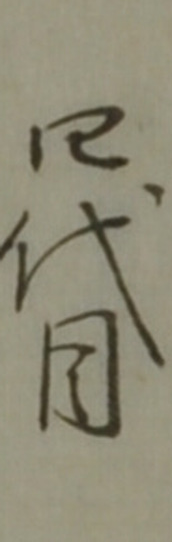四代目
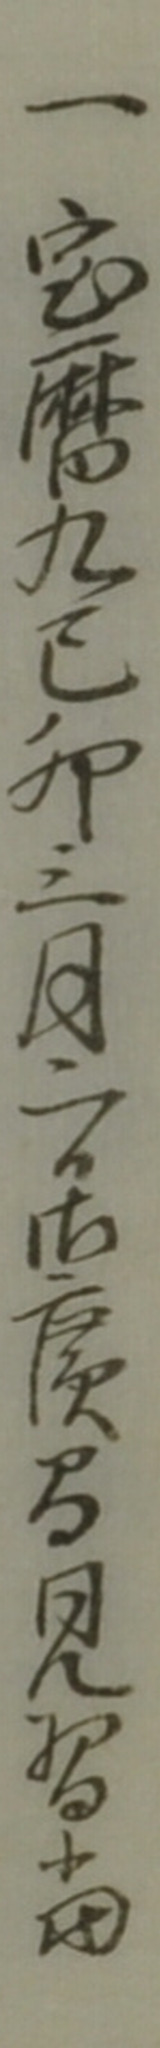一宝暦九己卯三月二日御広間見習当
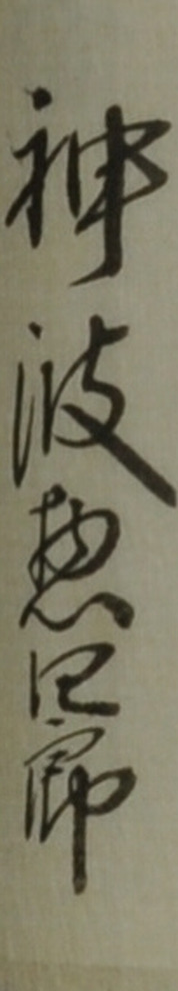神波惣四郎
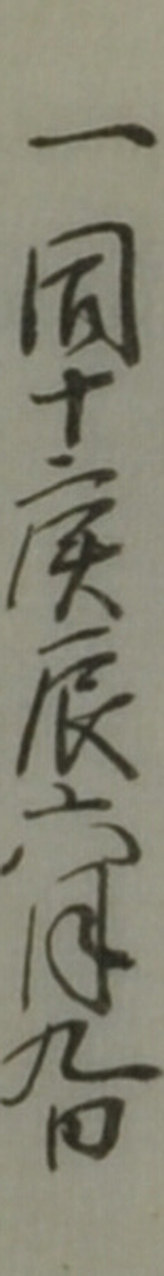一同十庚辰六月九日
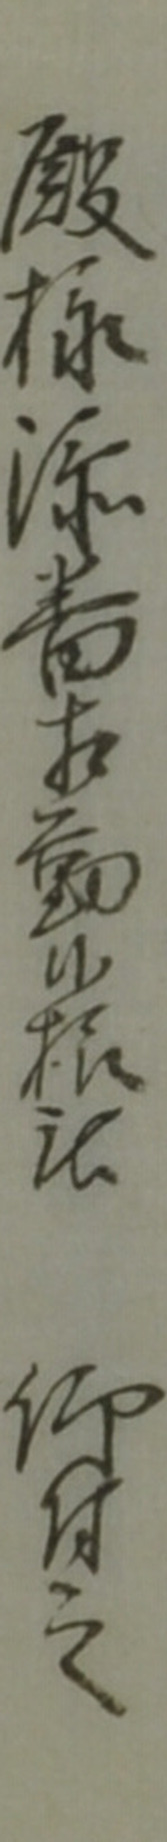殿様添番相勤候様被仰付之
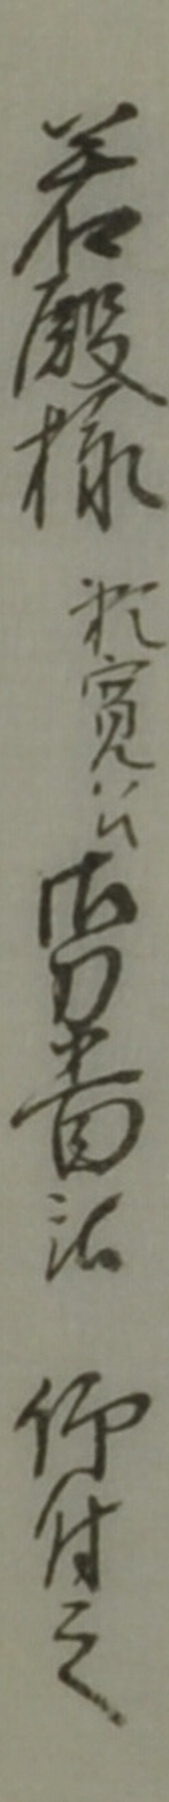若殿様頼寛公御刀番被仰付之
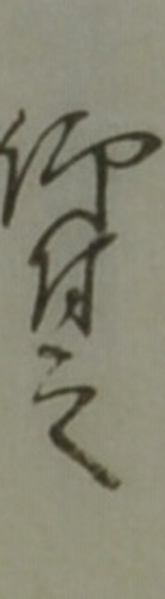仰付之
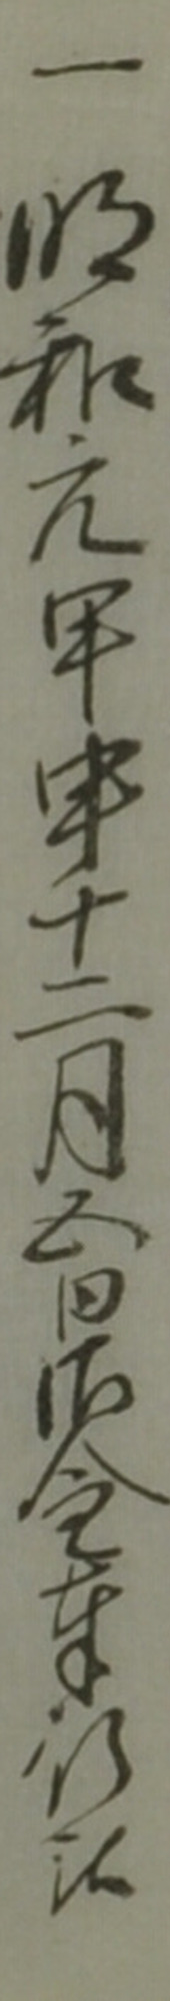一明和元年甲申十二月五日御金奉行被
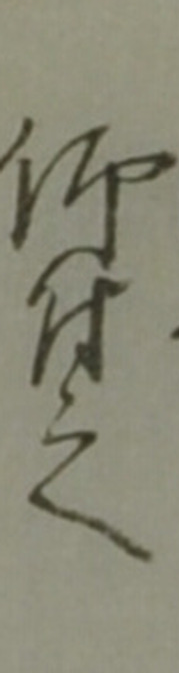仰付之
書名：諸御役代々録（八）
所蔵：伊那市立高遠町図書館・合同会社AMANE
